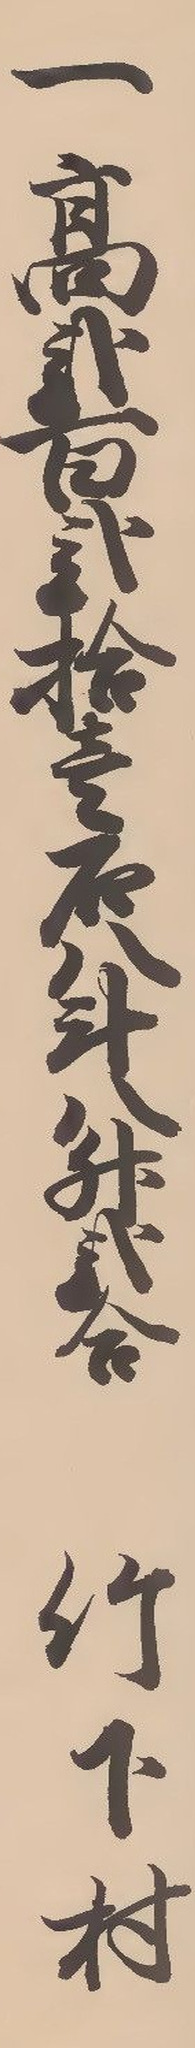一高弐百弐拾壱石八斗八升弐合竹下村
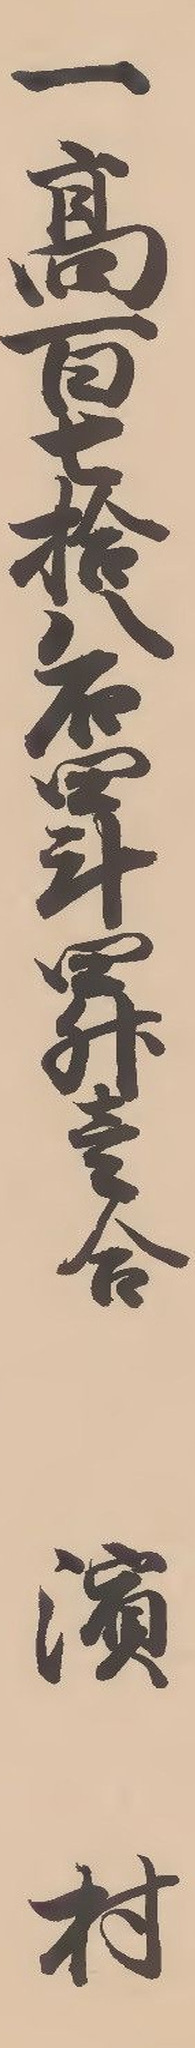一高百七拾八石四斗四升壱合浜村
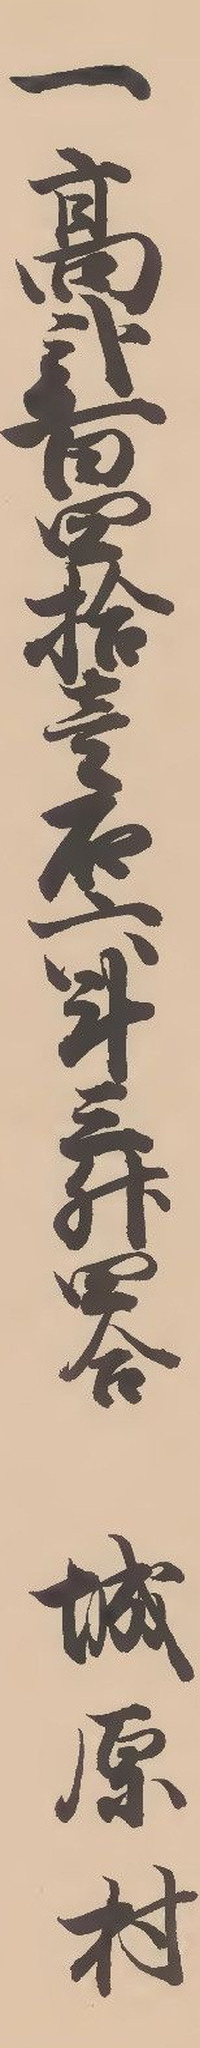一高弐百四拾壱石六斗三升四合城原村
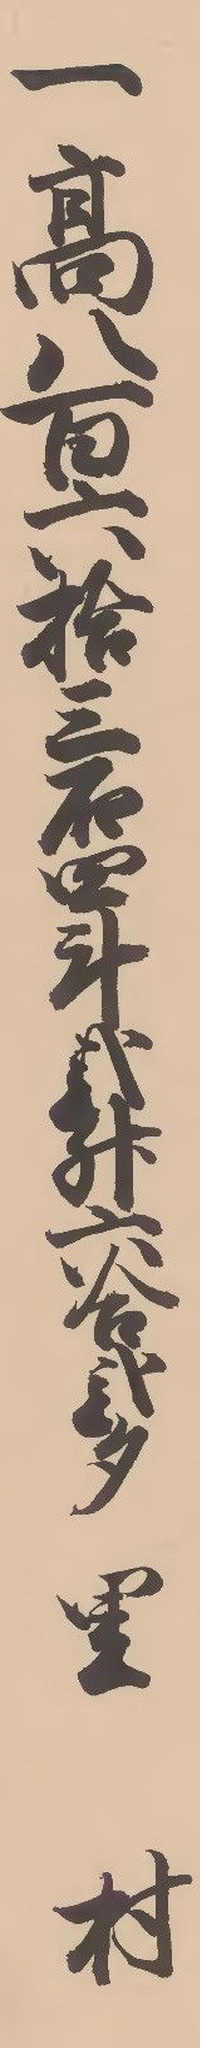一高八百六拾三石四斗弐升六合弐勺里村

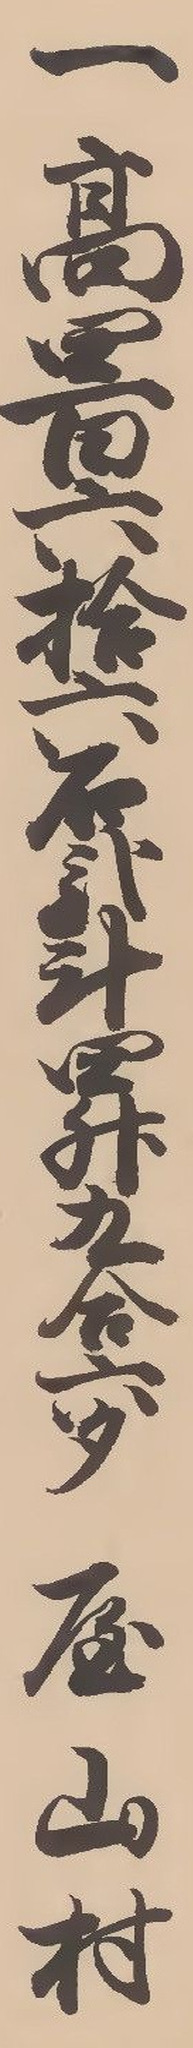一高四百六拾六石弐斗四升九合六勺屋山村
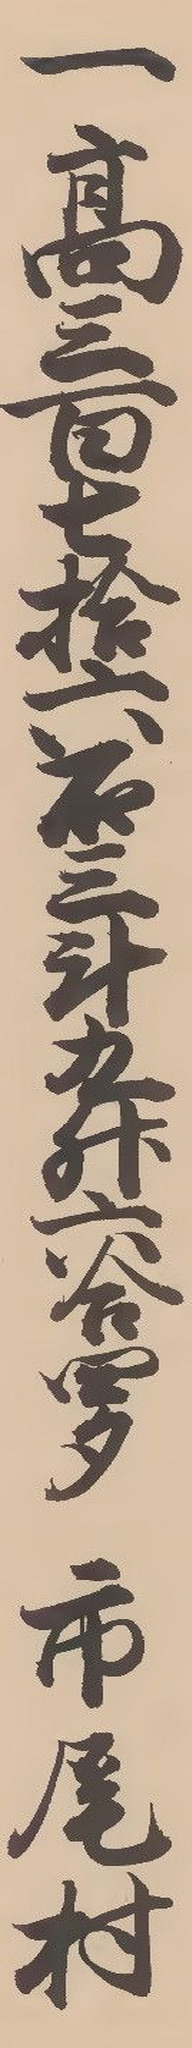一高三百七拾六石三斗九升六合四勺市尾村
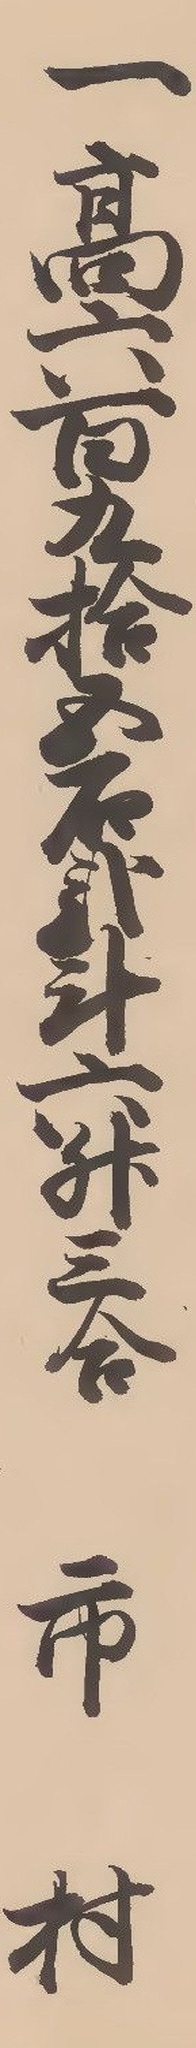一高六百九拾五石弐斗六升三合市村
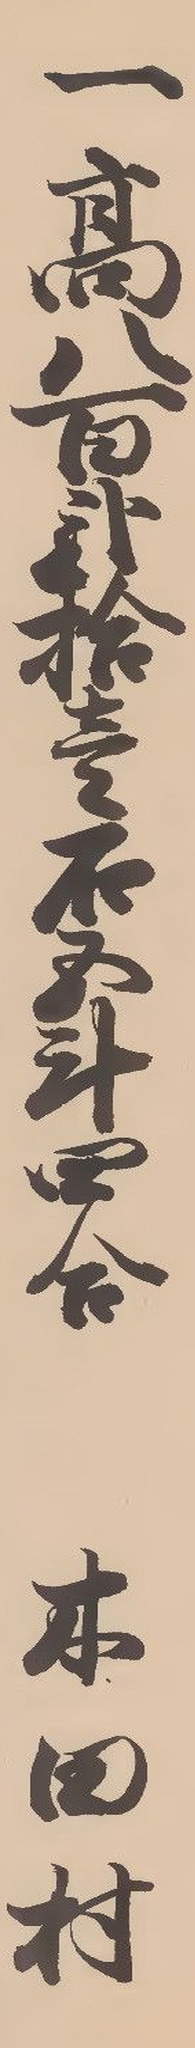一高八百弐拾壱石五斗四合木田村
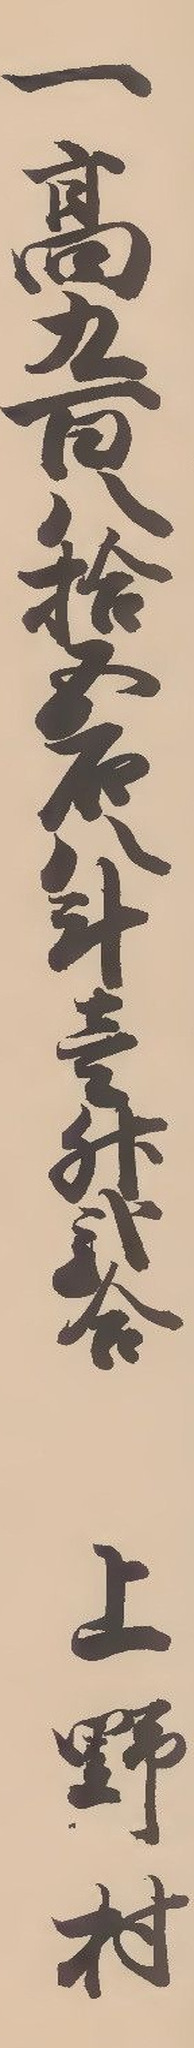一高九百八拾五石八斗壱升弐合上野村
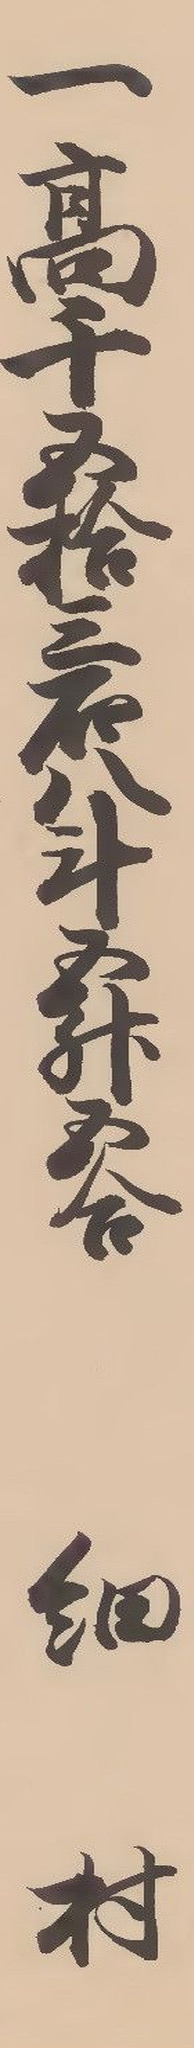一高千五拾三石八斗五升五合細村
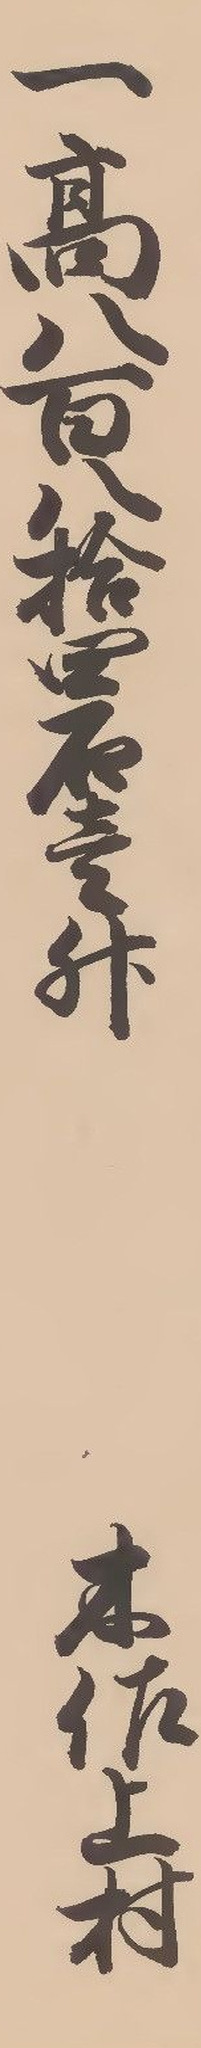一高八百八拾四石壱升木佐上村
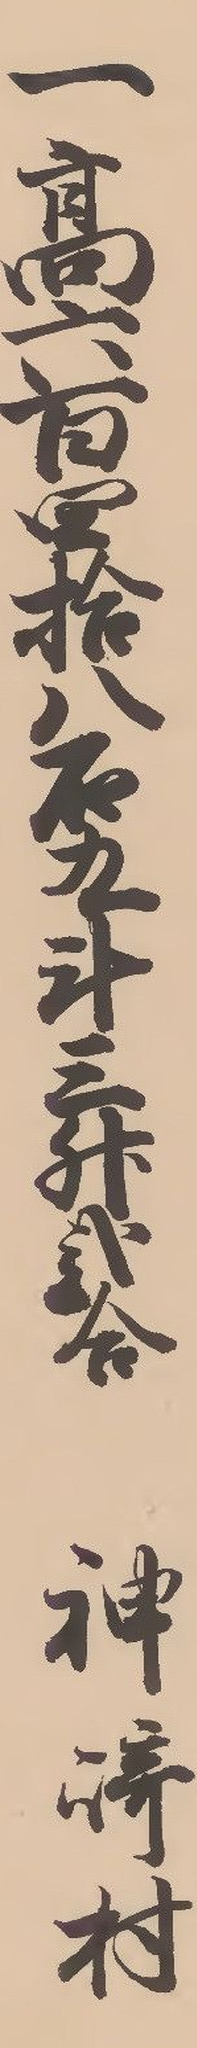一高六百四拾八石九斗三升弐合神崎村

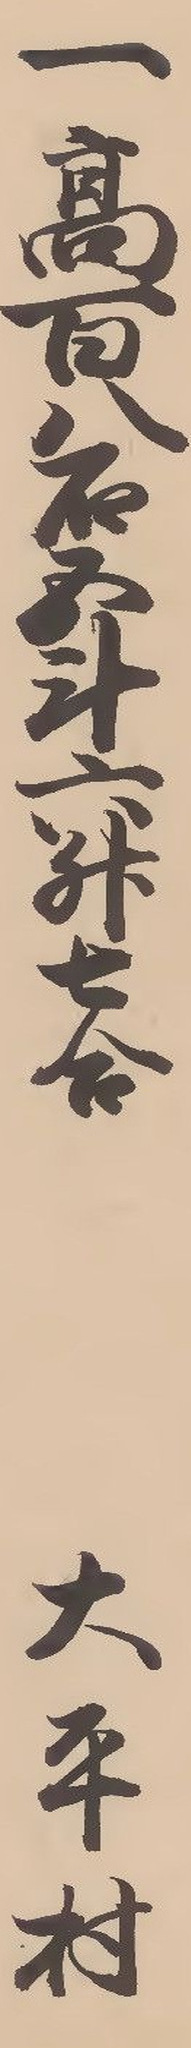一高百八石五斗六升七合大平村
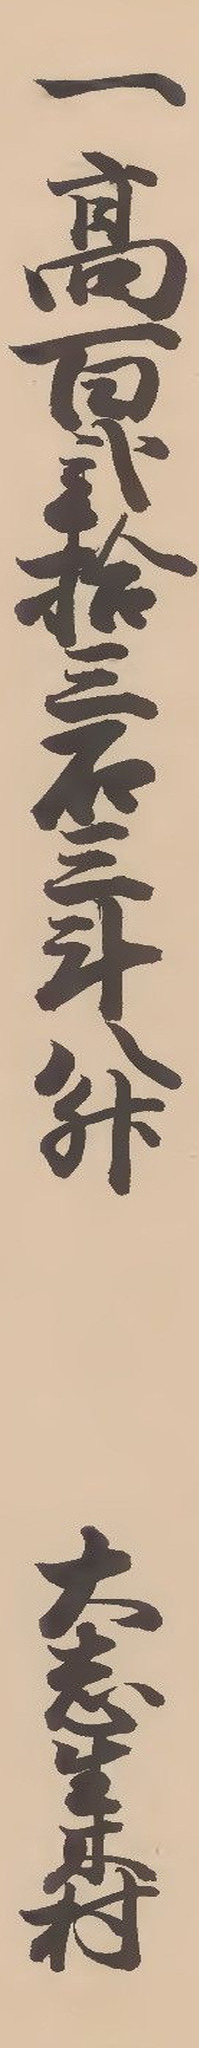一高百弐拾三石三斗八升大志生木村
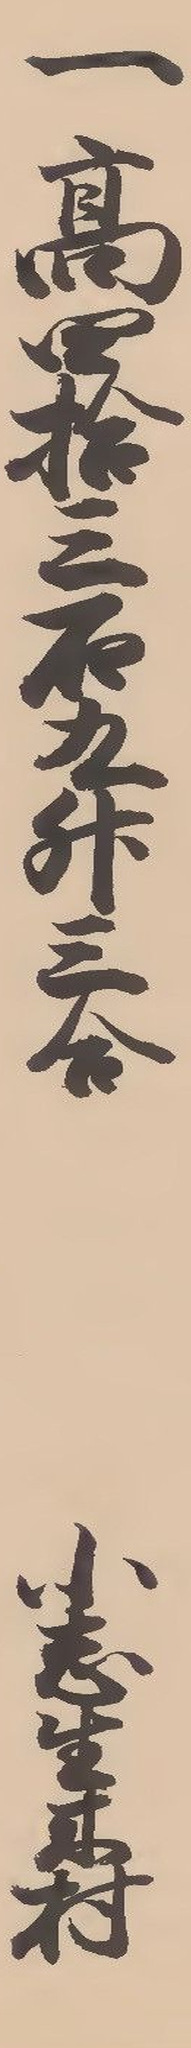一高四拾三石九升三合小志生木村
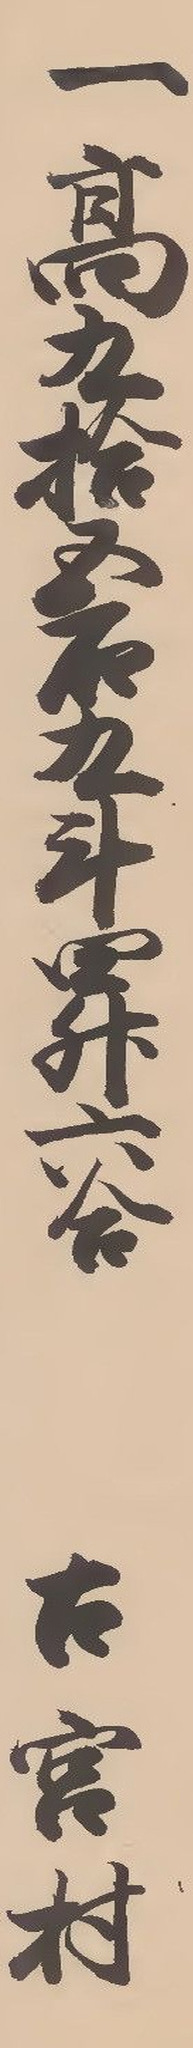一高九拾五石九斗四升六合古宮村
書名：豊後国郷帳
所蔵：国立公文書館 National Archives of Japan
